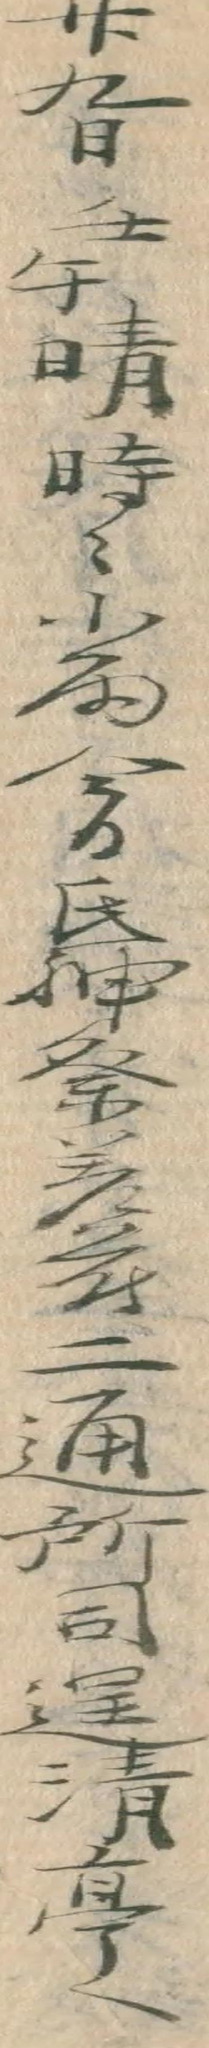廿九日壬午晴時〻小雨今日氏神祭差符二通所司逞清亭へ
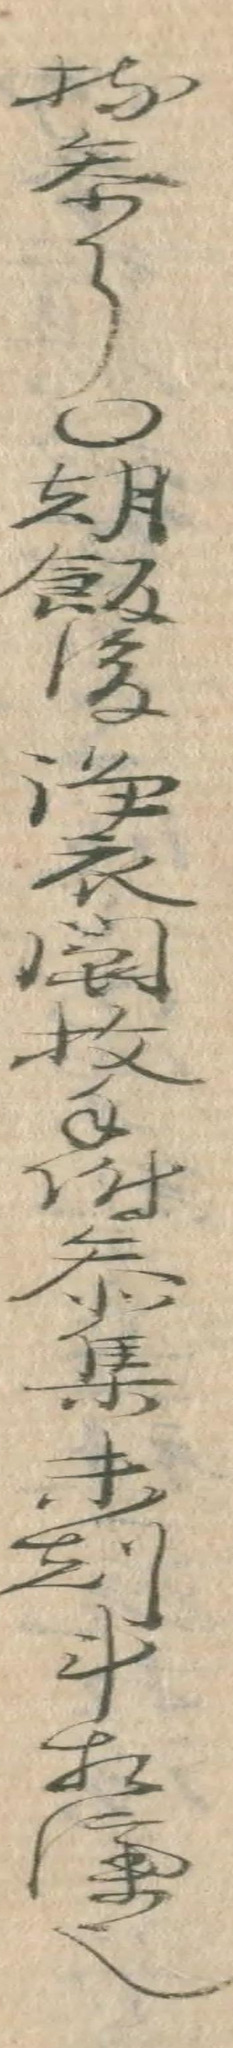持参了○朝飯後浄衣鬮牧手附参集未刻斗相済也
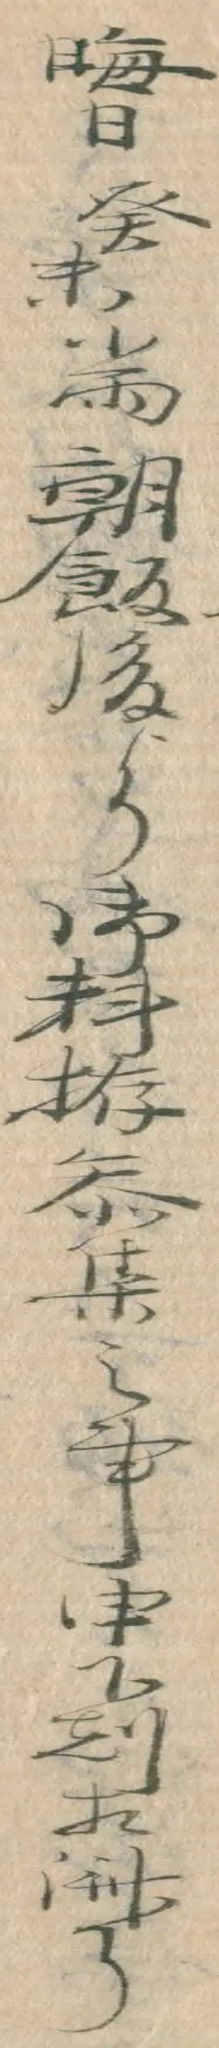晦日癸未小雨朝飯後より御料拵参集之事申下刻相済了
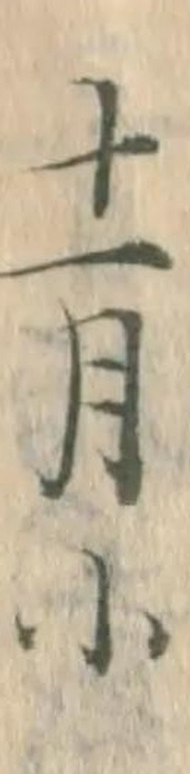十一月小
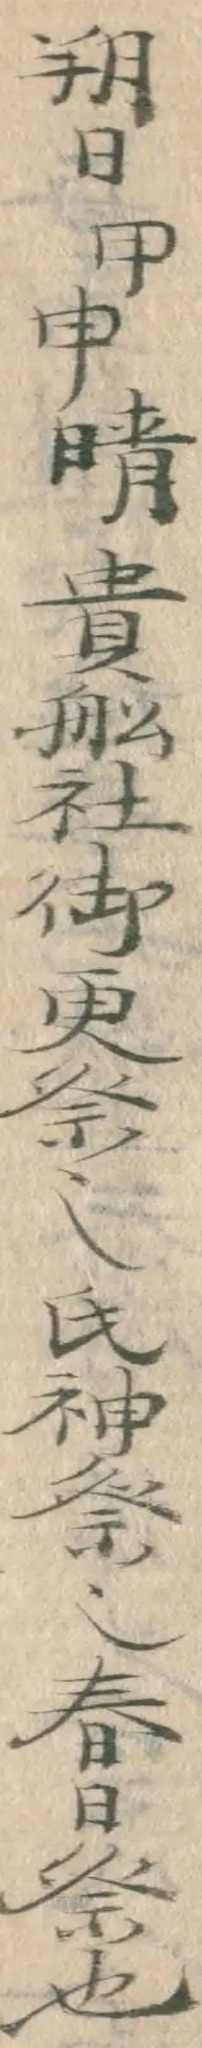朔日甲申晴貴舩社御更祭也氏神祭也春日祭也
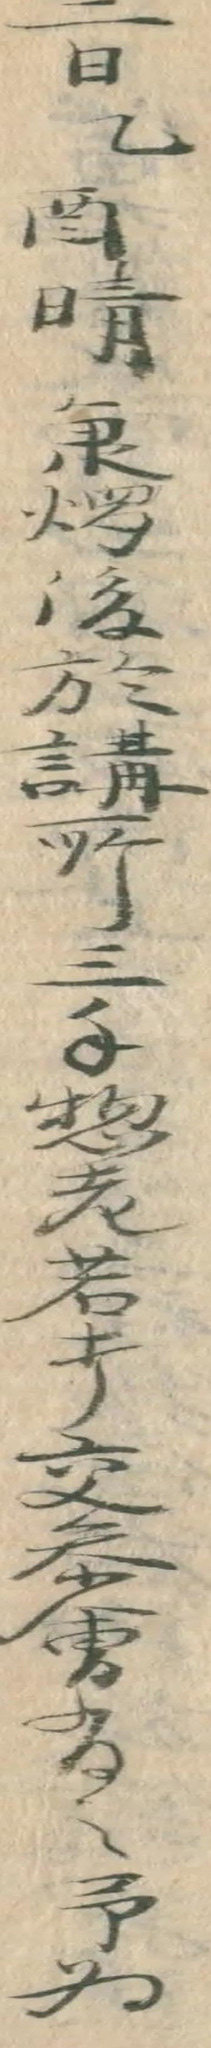二日乙酉晴秉燭後於講所三手惣老若打交参會有之予為
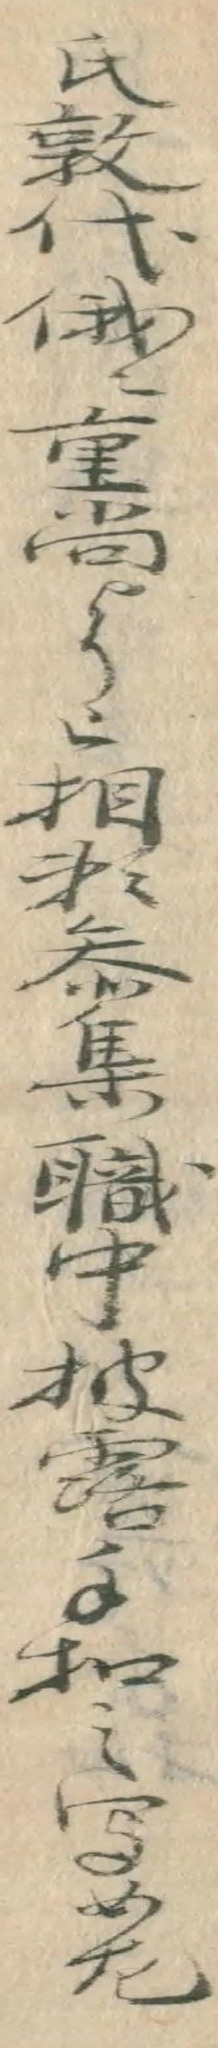氏敦代俄ニ重尚より被相頼参集職中披露手扣之写如左

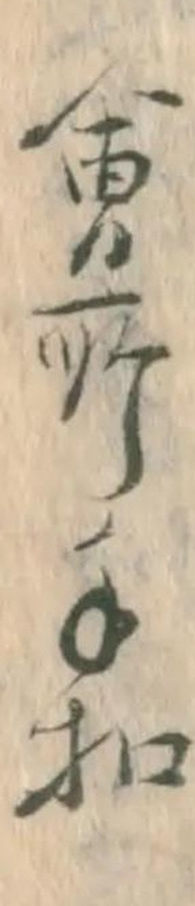會所手扣
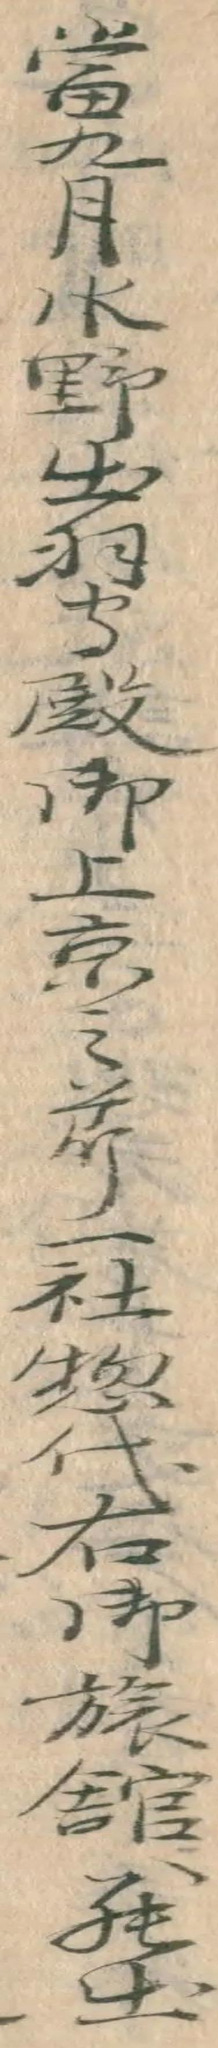當九月水野出羽守殿御上京之節一社惣代右御旅館へ罷出
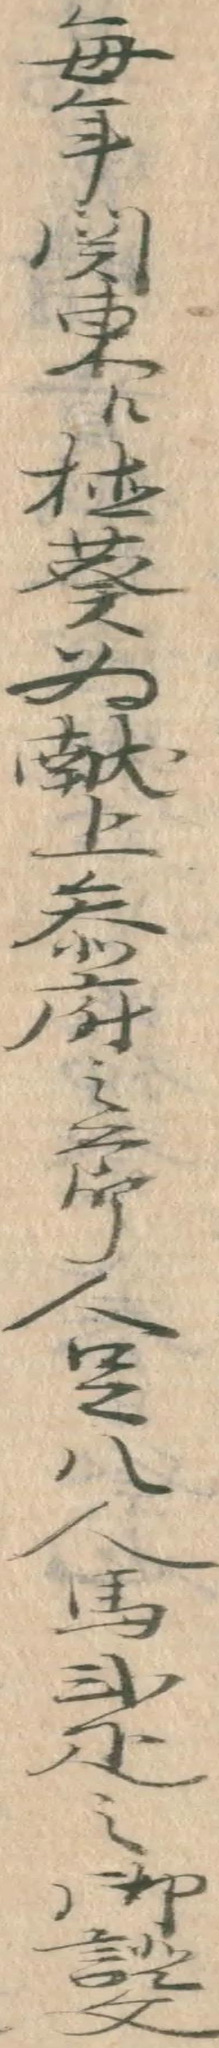毎年関東え植葵為献上参府之節人足八人馬弐疋之御證文
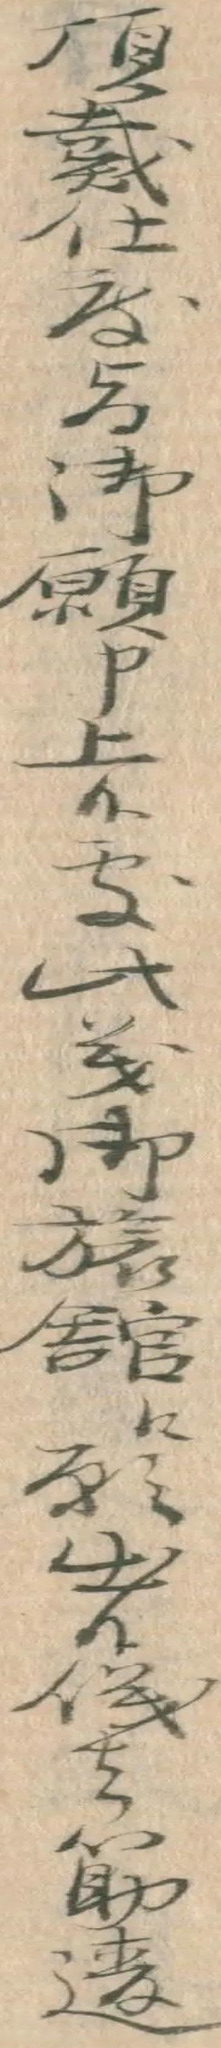頂戴仕度旨御願申上候處此義御旅館え願出候儀は筋違
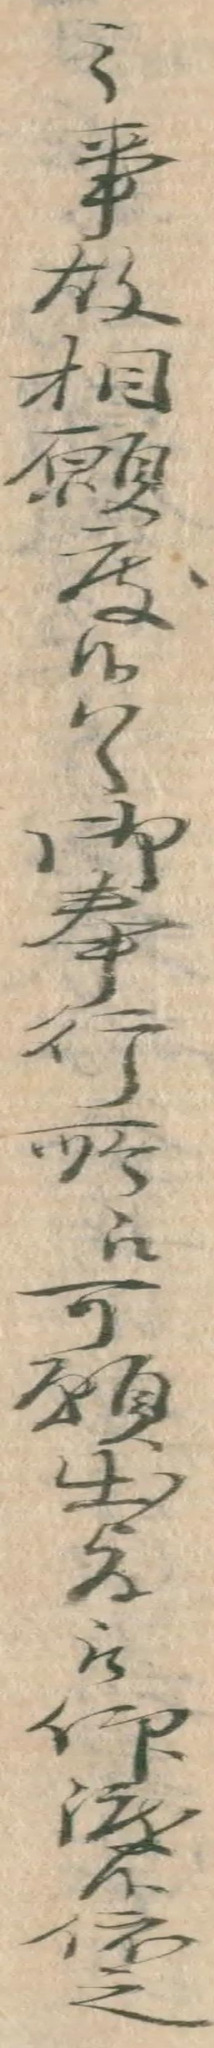之事故相願度候ハヽ御奉行所え可願出旨被仰渡候依之
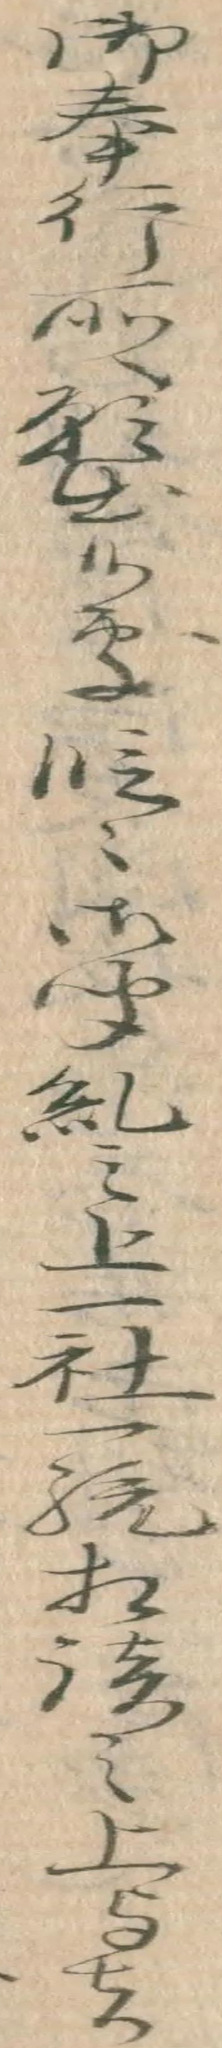御奉行所へ願出候處段々御聞糺之上一社一統相談之上与者
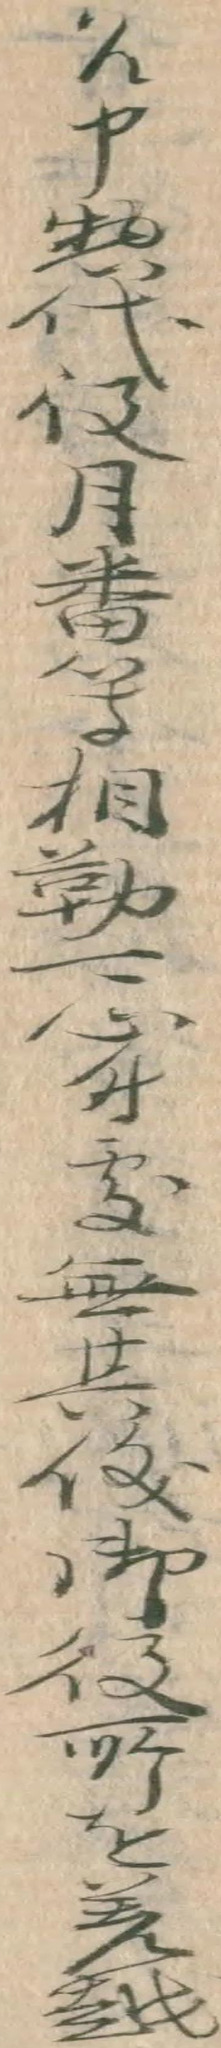申惣代役月番等相勤可心付處無其儀御役所を差越
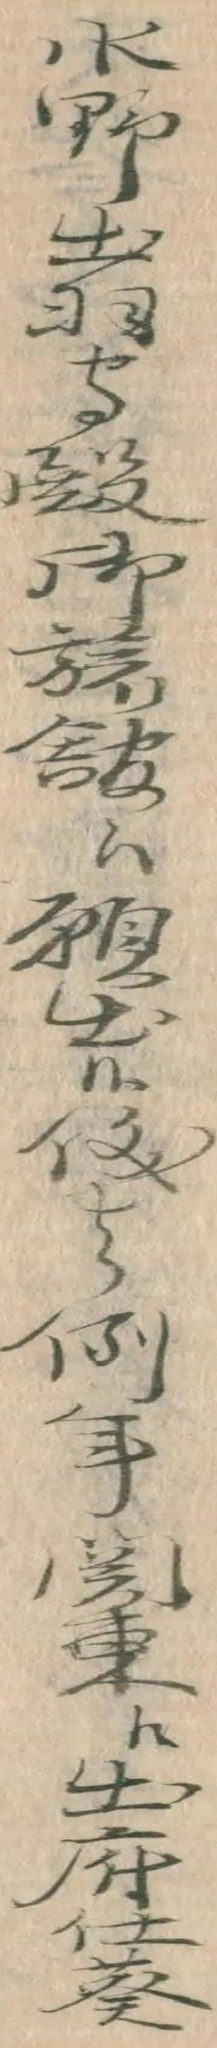水野出羽守殿御旅館え願出候儀は未年関東え出府仕葵
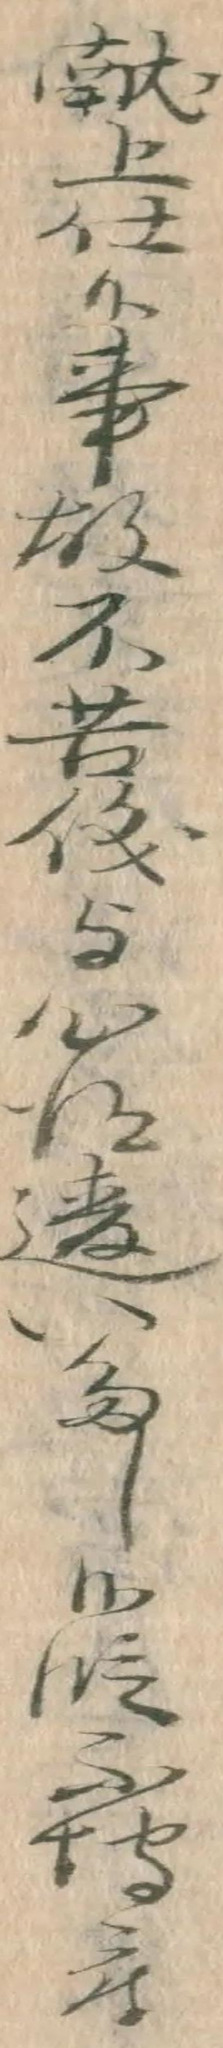献上仕候事故不苦儀と心得違いたし候段不埒ニ付
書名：賀茂社記録. 第65冊
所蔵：国立国会図書館 National Diet Library, JAPAN
